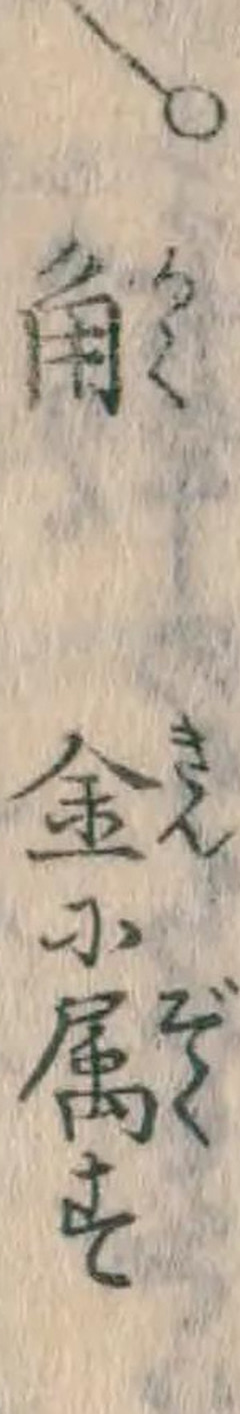角金に属す
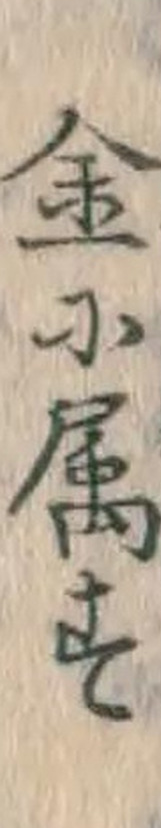角金に属す
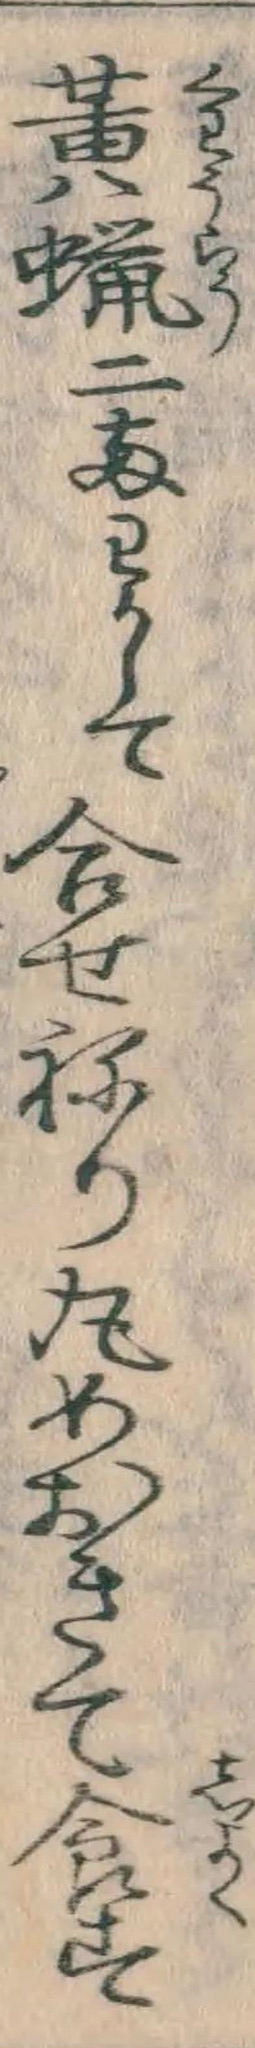黄蠟二両わかして合せねり丸めおきて食す
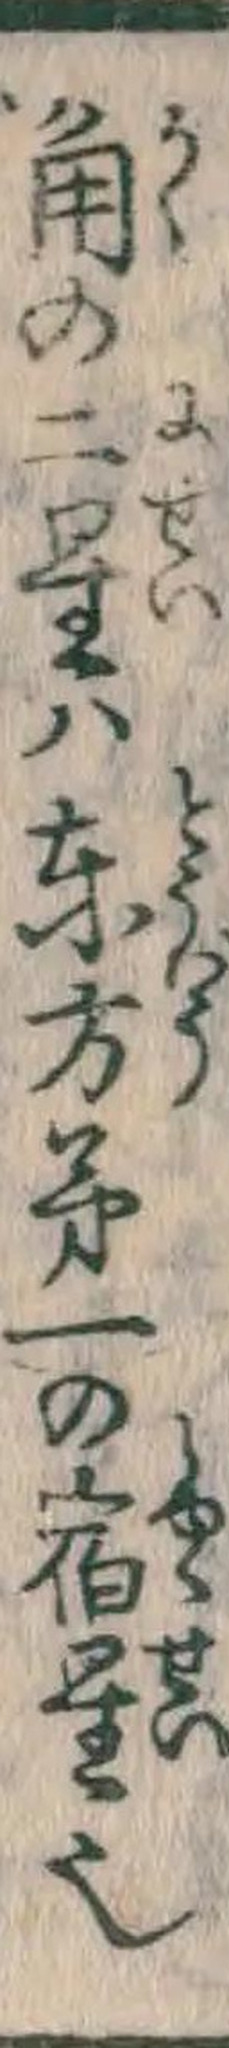角の二星は東方第一の宿星也
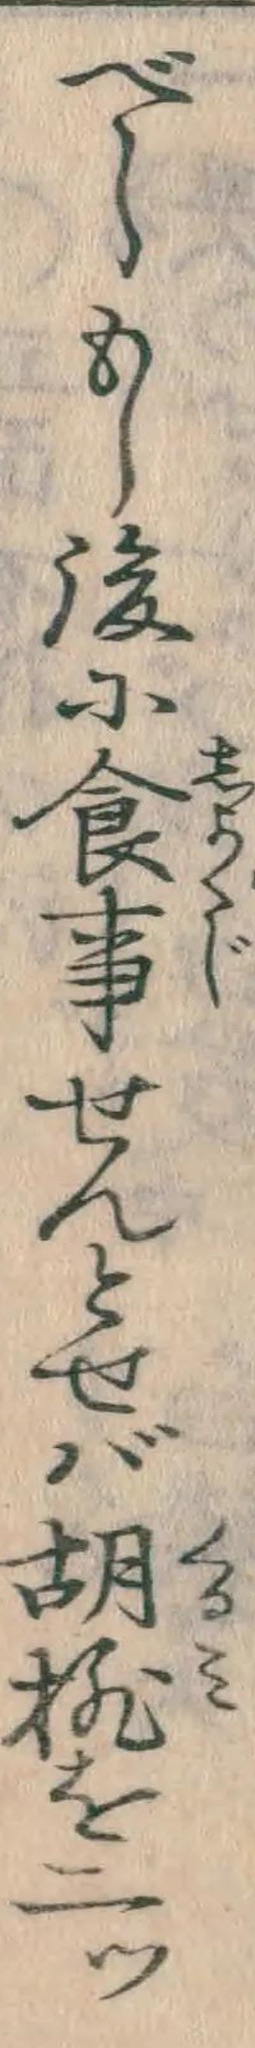べしもし後に食事せんとせば胡桃を二ッ
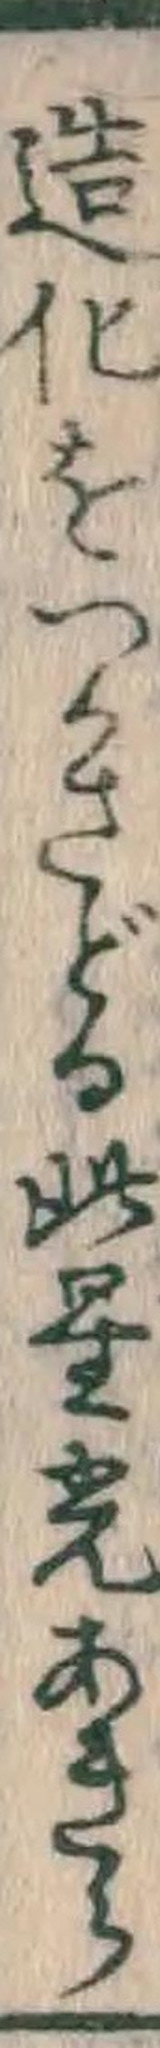造化をつかさどる此星光あきら
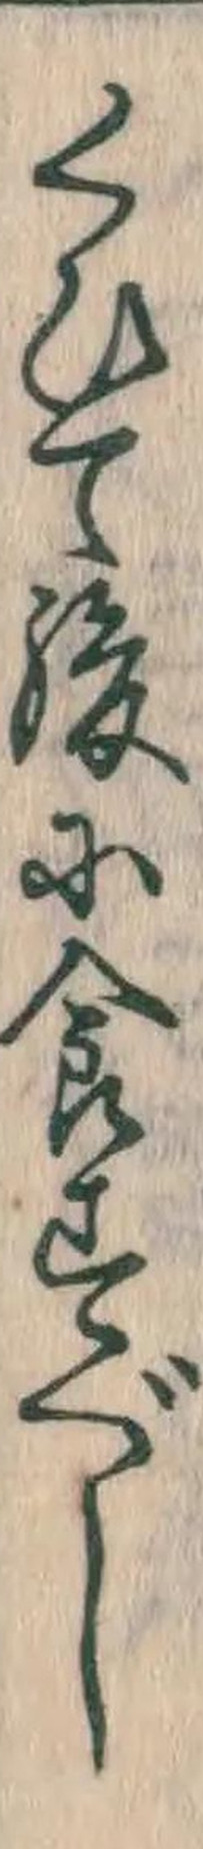くひて後に食すべし
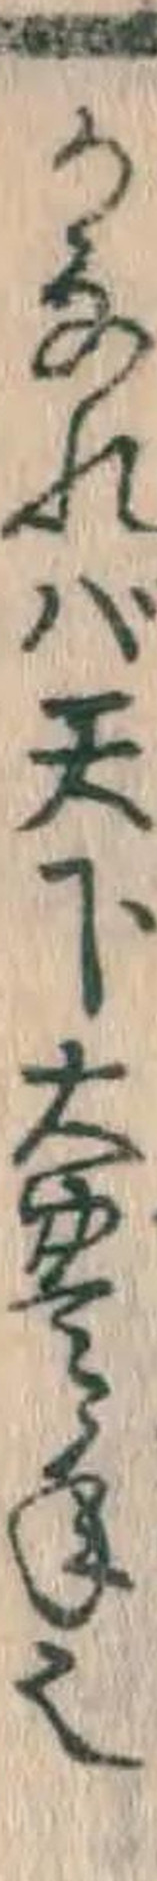かなれば天下大豊年也
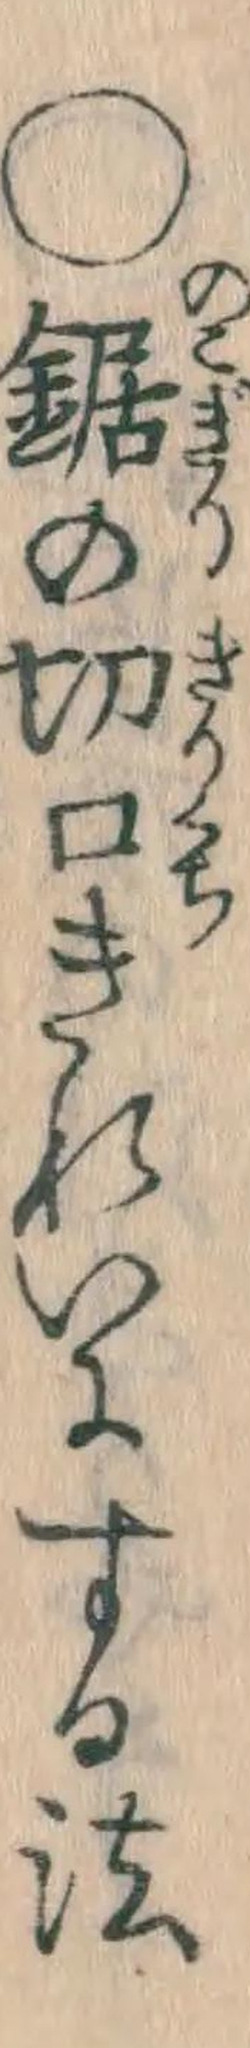○鋸の切口きれいにする法
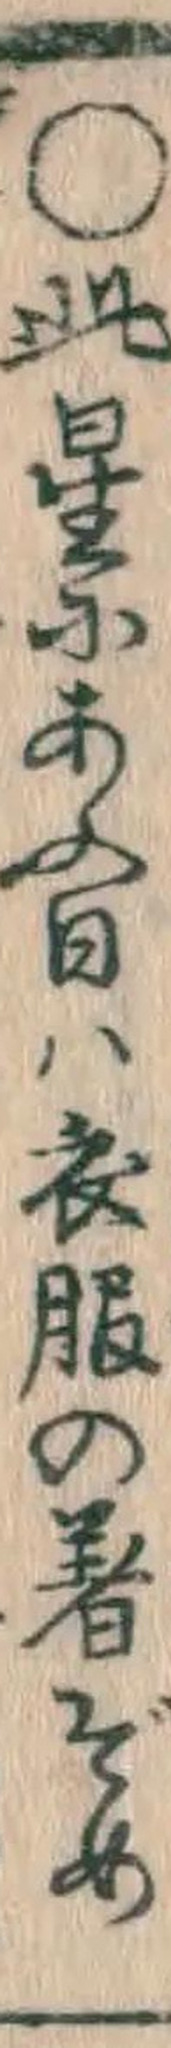○此星にあふ日は衣服の着ぞめ
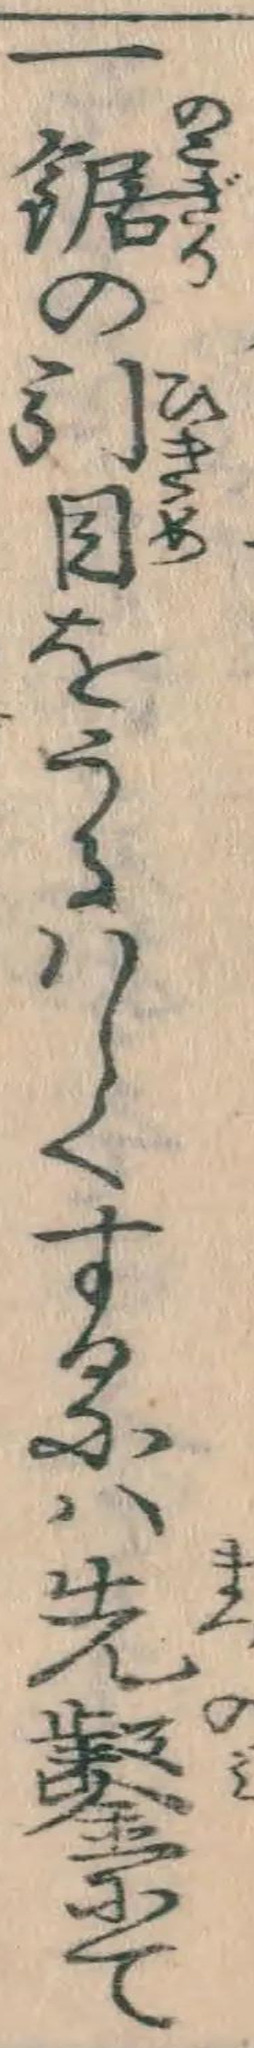一鋸の引目をうるはしくするには先鑿にて
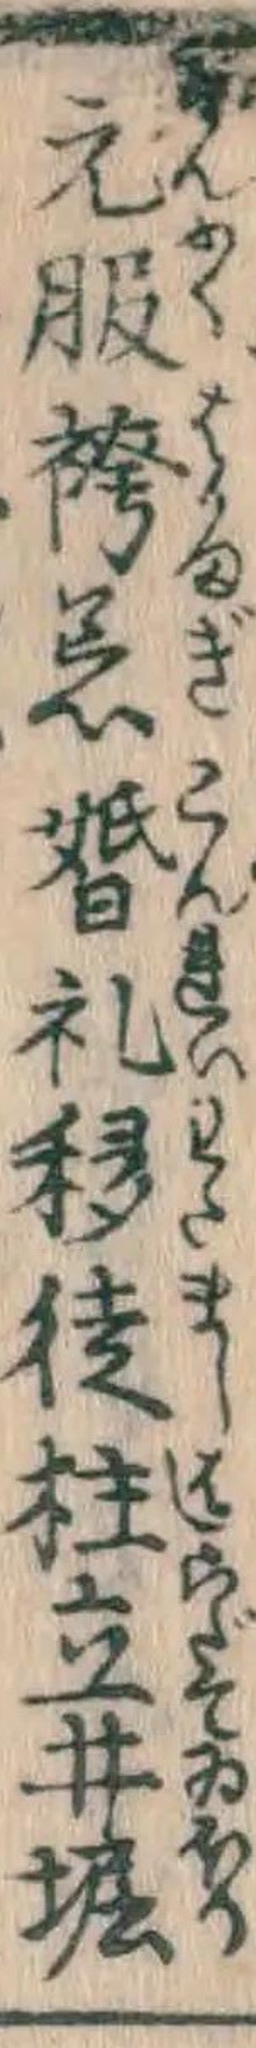元服袴着婚礼移徒柱立井掘
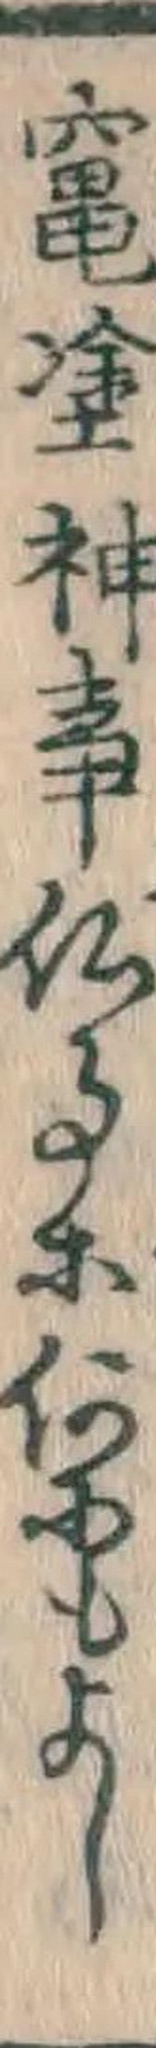竃塗神事仏事等何にもよし
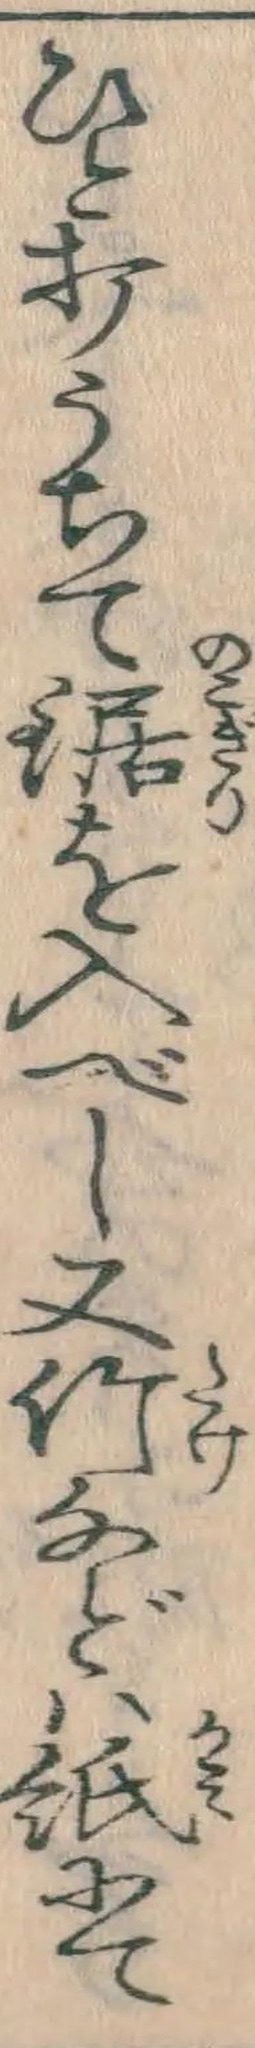ひと打うちて鋸を入べし又竹などは紙にて
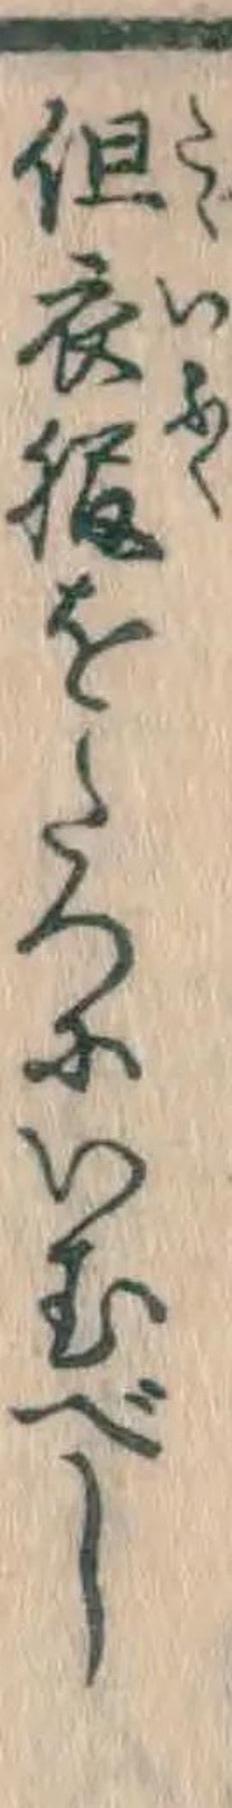但衣服をたつにいむべし
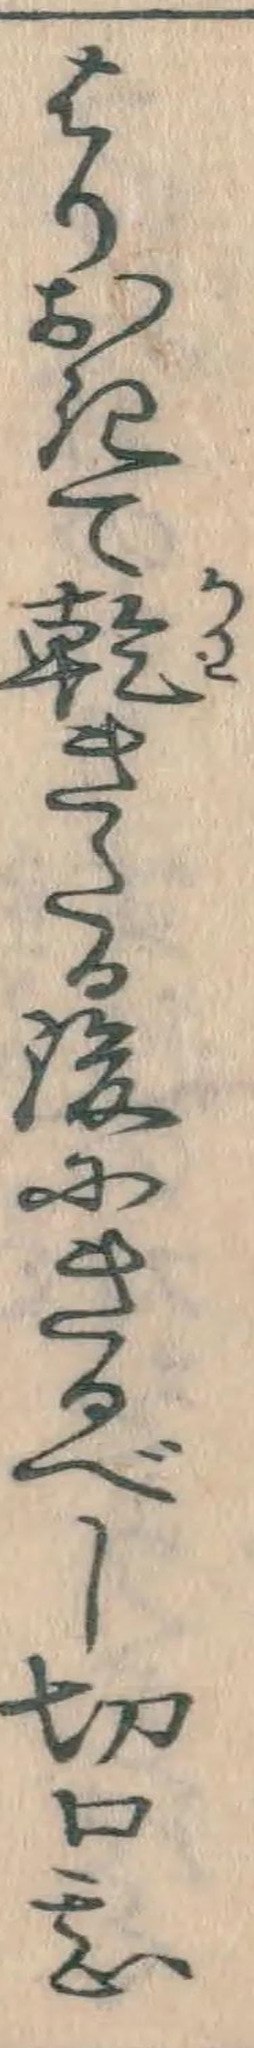はりおきて乾きたる後にきるべし切口甚
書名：広益秘事大全 3巻. [2]
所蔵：国立国会図書館 National Diet Library, JAPAN
